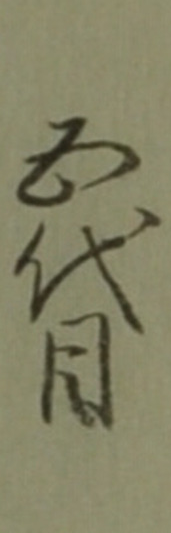五代目
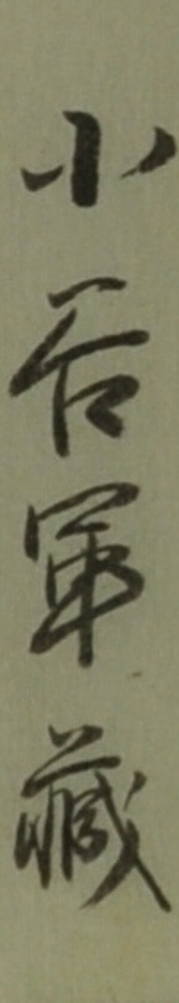小谷軍蔵
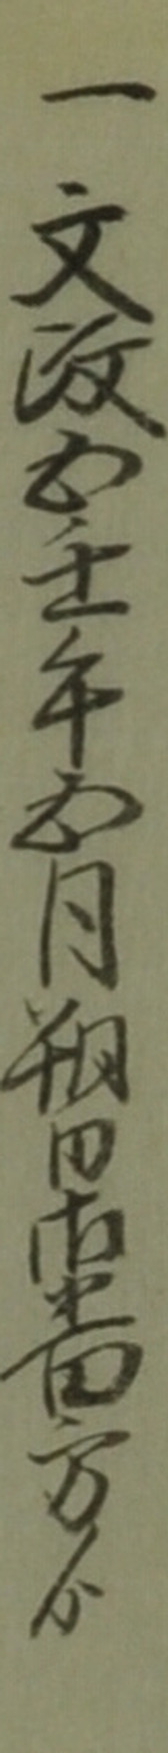一文政五壬午五月朔日御番方ゟ
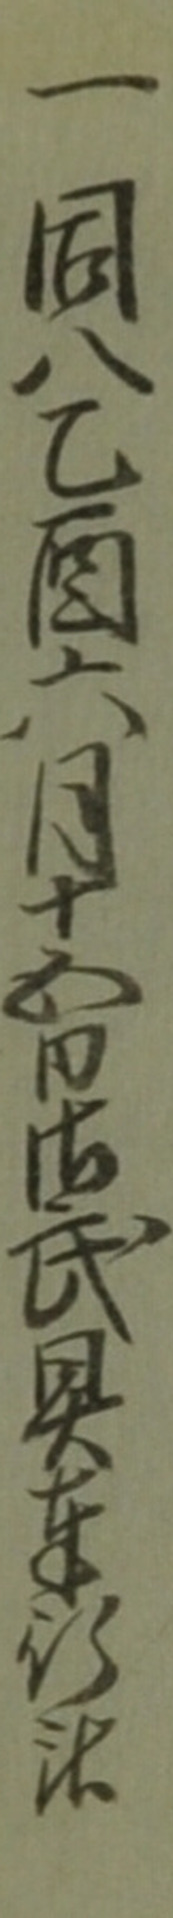一同八乙酉六月十五日御武具奉行被
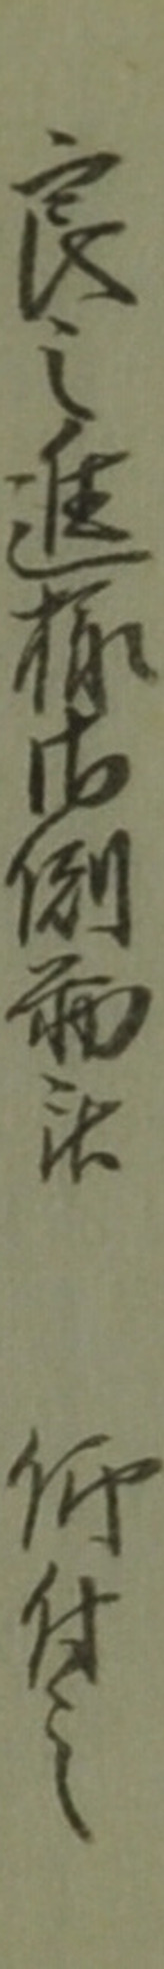良之進様御側勤被仰付之
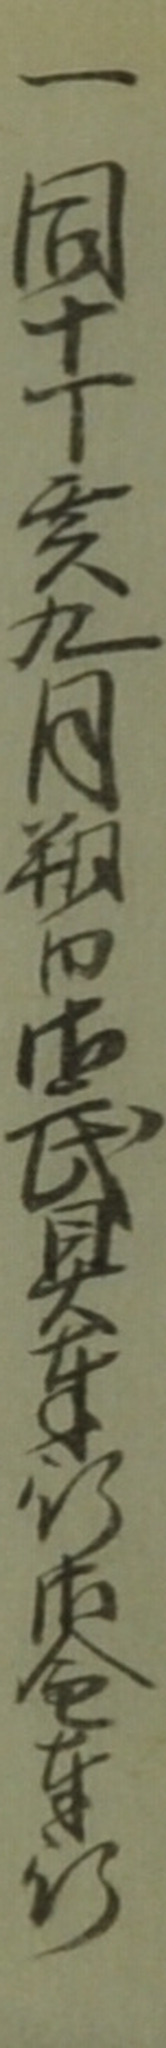一同十丁亥九月朔日御武具奉行御金奉行
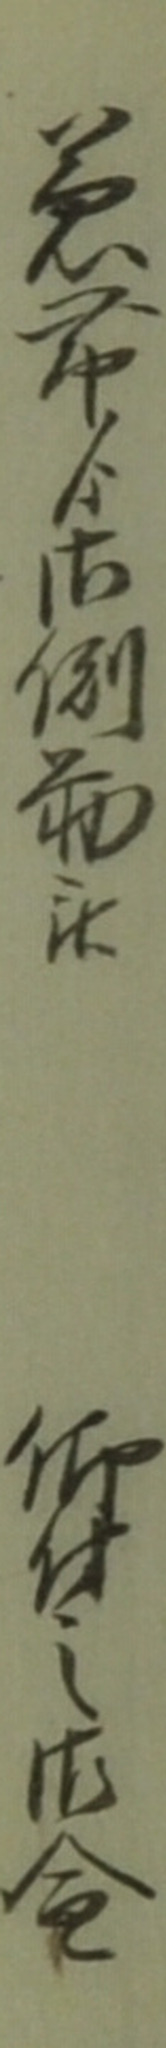兼帯ゟ御側勤被仰付之御金
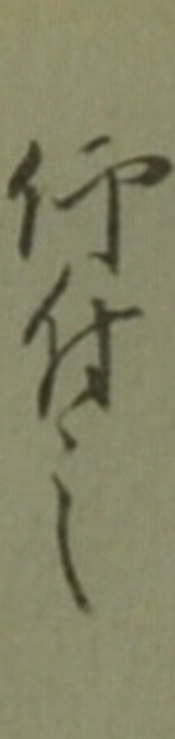仰付之
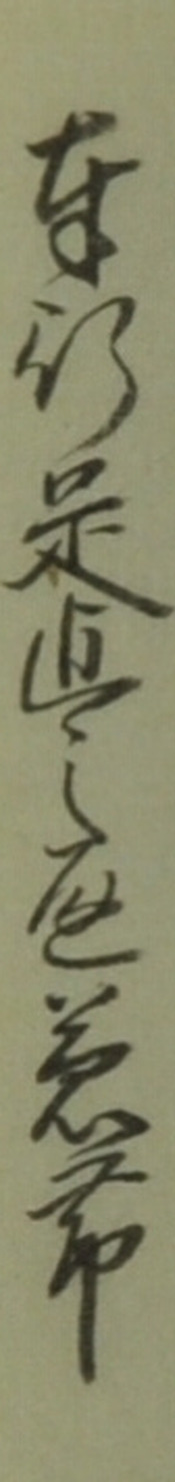奉行是迄之通兼帯

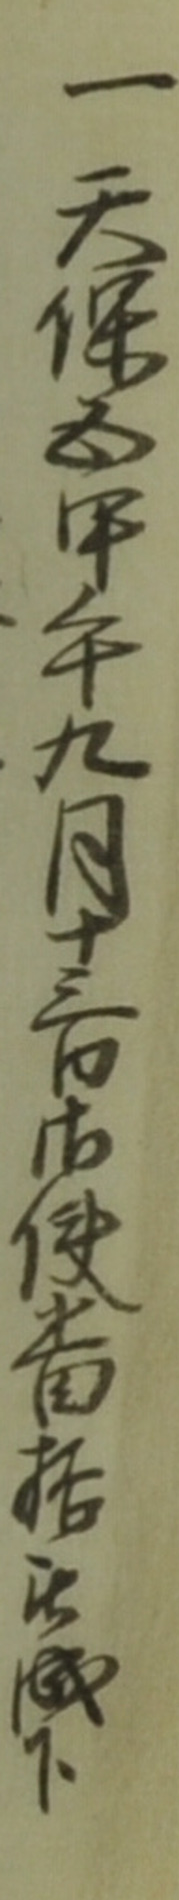一天保五甲午九月十三日御使番格被成下
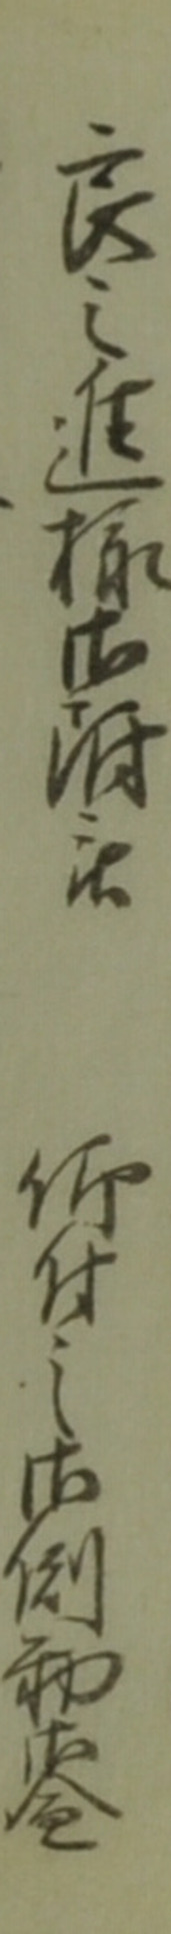良之進様御附被仰付之御側勤御金
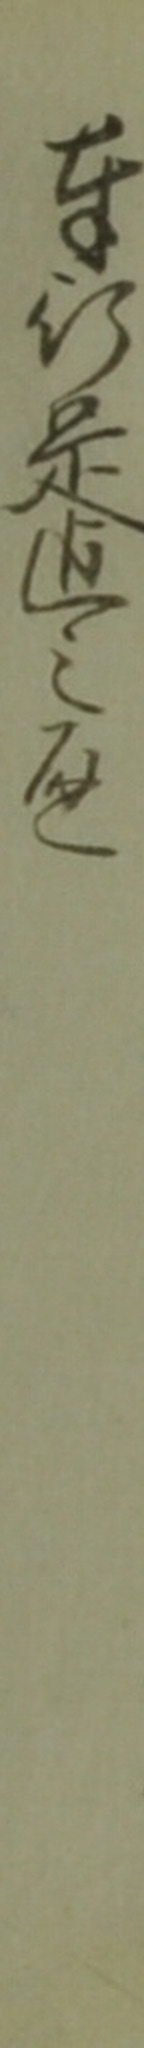奉行是迄之通
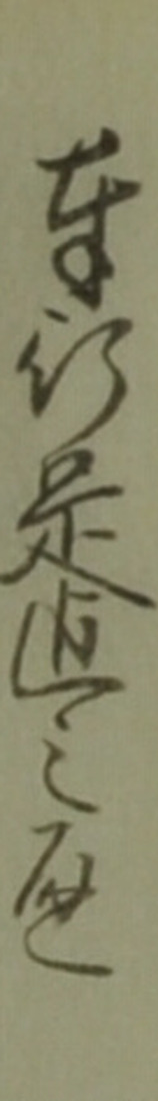奉行是迄之通
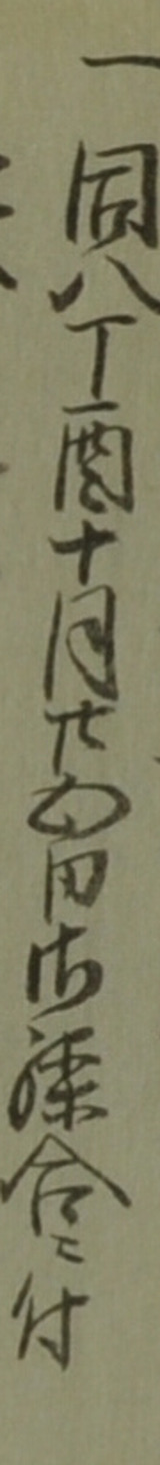一同八丁酉十月廿五日御繰合ニ付
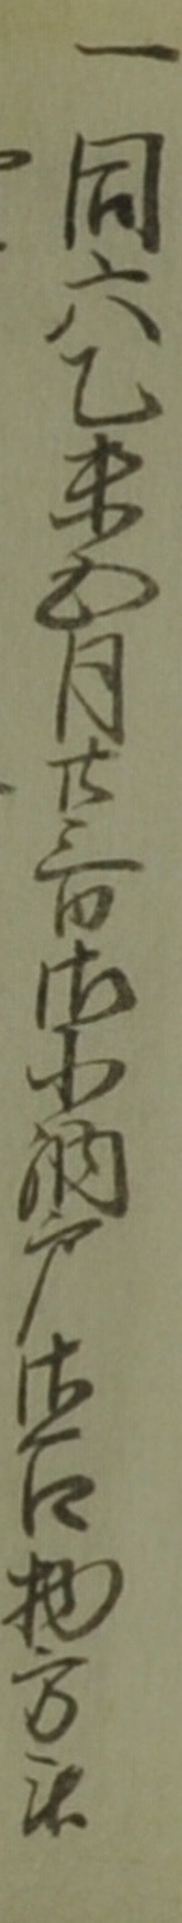一同六乙巳五月廿三日御小納戸御召物方被
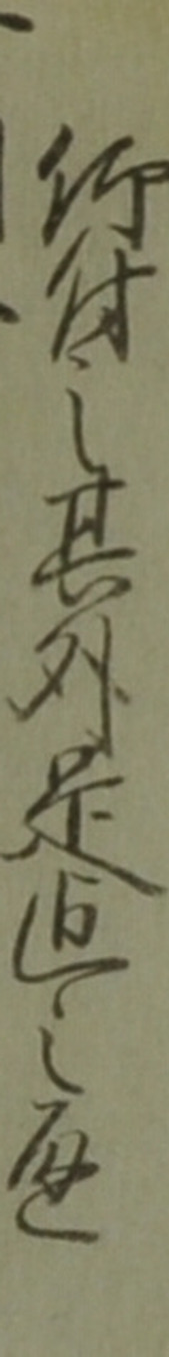仰付之其外是迄之通
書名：諸御役代々録（五）
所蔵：伊那市立高遠町図書館・合同会社AMANE
